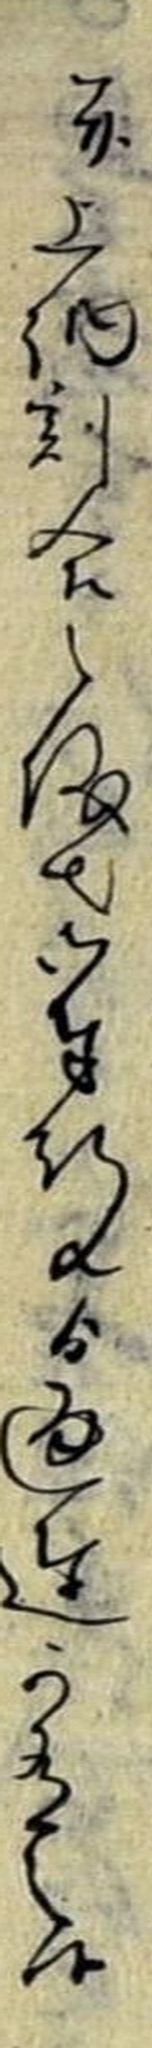并上納割合之儀者御奉行共ゟ通達可有之候
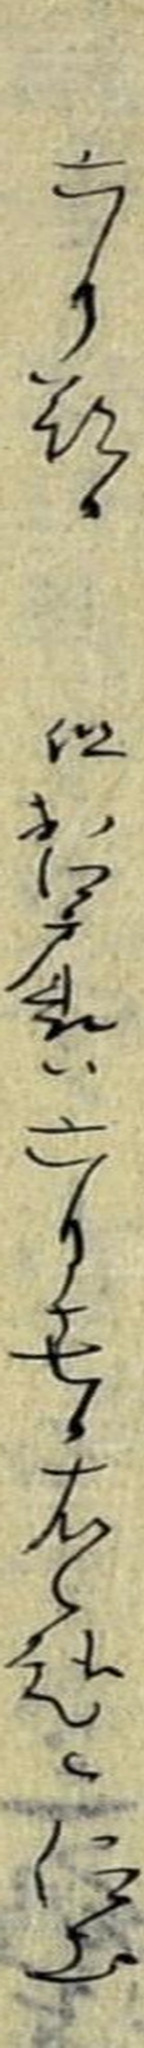六月朔日但於江戸表ハ六月十七日右之趣被仰出
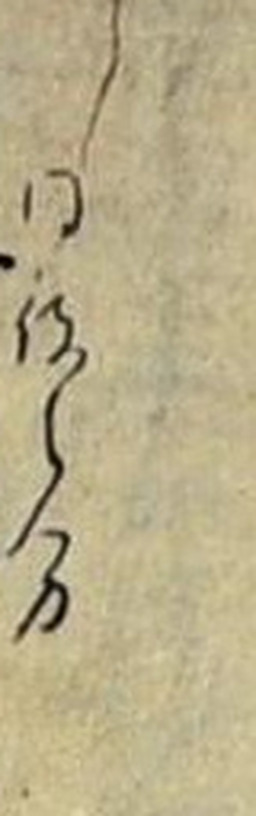同役之分
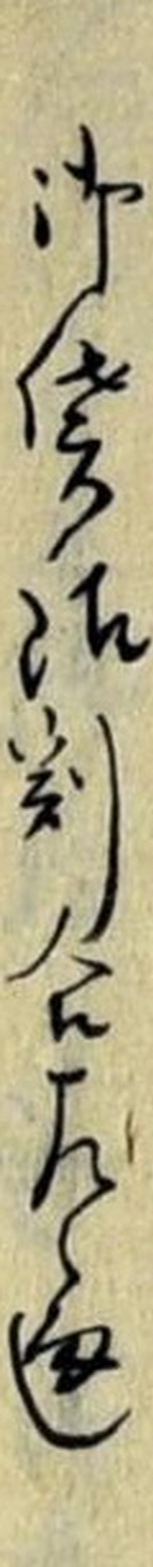御貸銀割合左之通
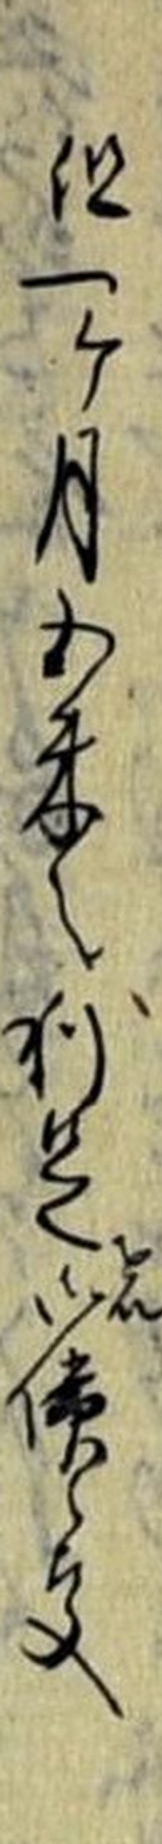但一ケ月五朱之利足を以御償候事
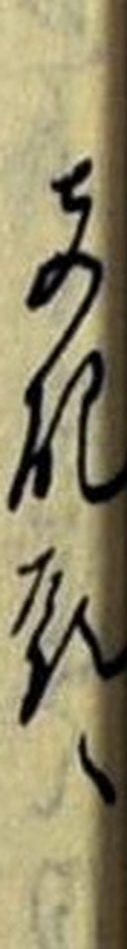支配頭へ
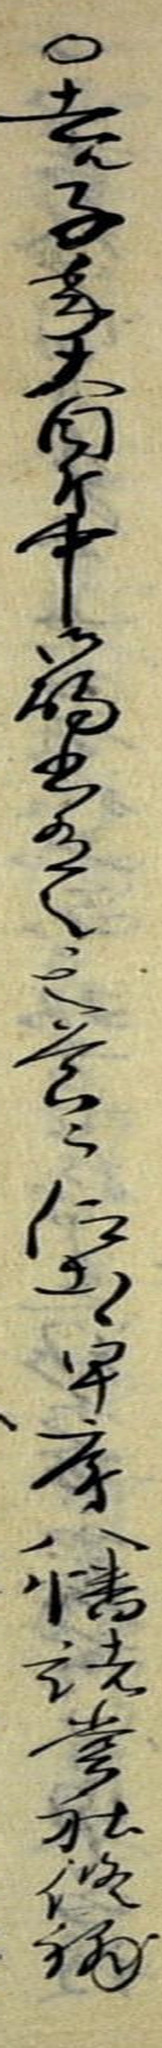〇去ル子年大目付中御触書有之其節被仰出候早房八幡諸堂社修補
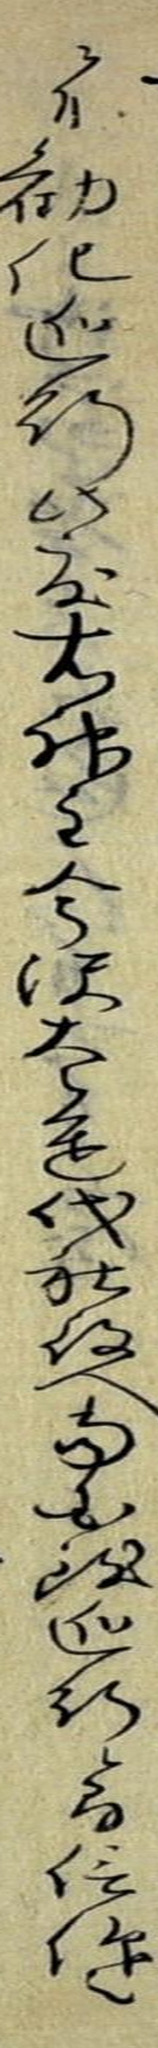ニ付勧化巡行此度右神主今沢大之進代社役人当国致巡行候間信仰之
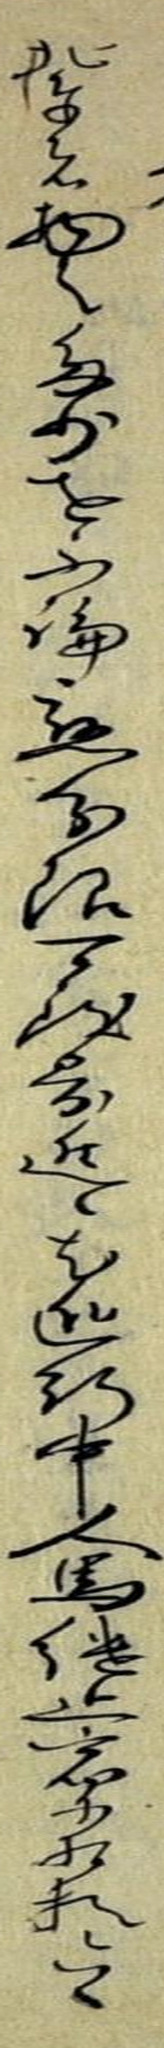輩者物之多少を不論応分銀可致寄進候尤巡行中人馬継止宿等相願候ハヽ
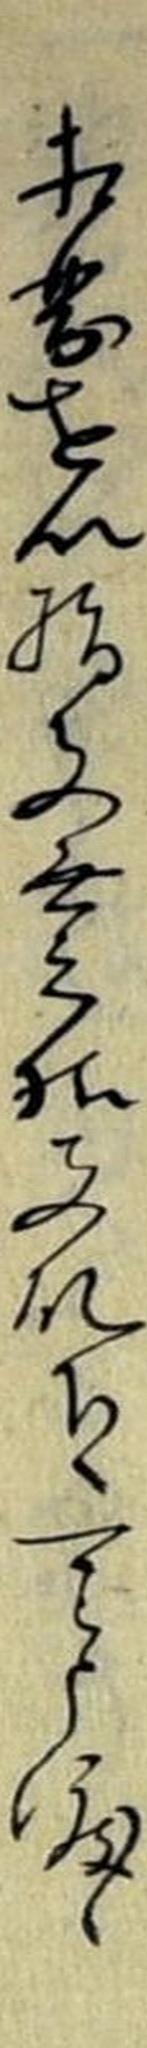相寄？を以指支無之様支配下へ可被申渡候
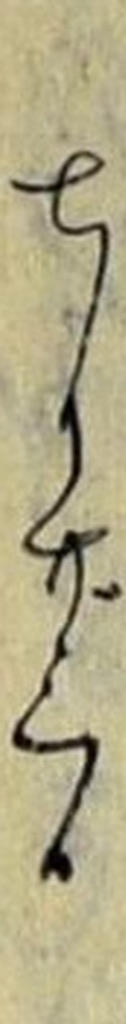七月廿三日
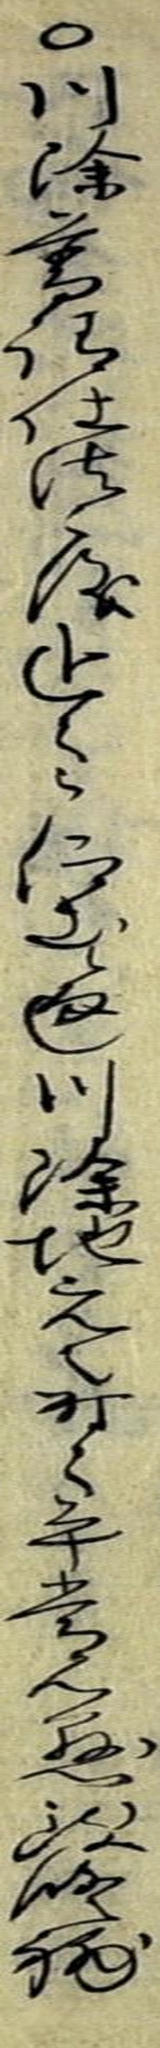〇川除普請仕法之儀追々被仰出候通川除地元之村々へ平常心懸致修補
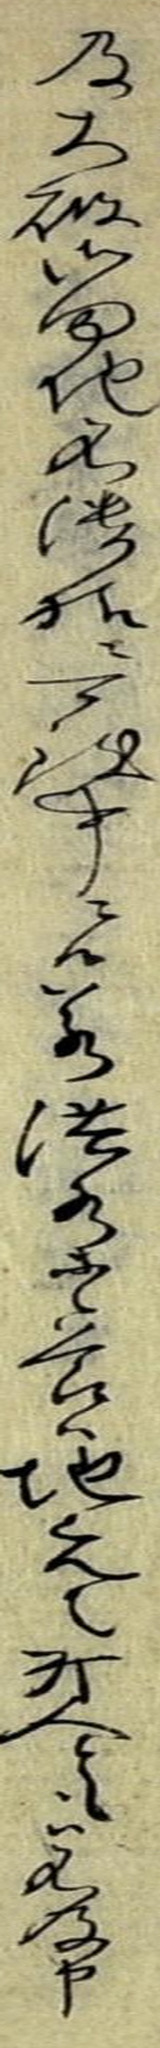及大破御田地不潰様ニ可致事ニ候若洪水等之節ハ地元之村人ともハ不及申
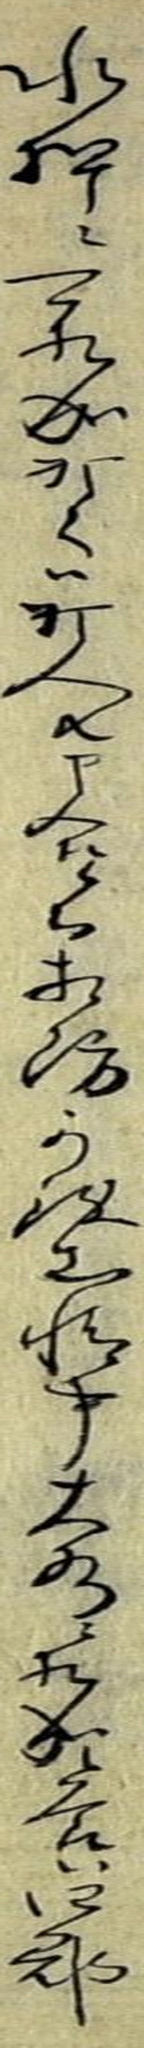水押ニ可相成村々ハ村人共申合候而相防可致出精事大水ニ相成候節ハ四郡
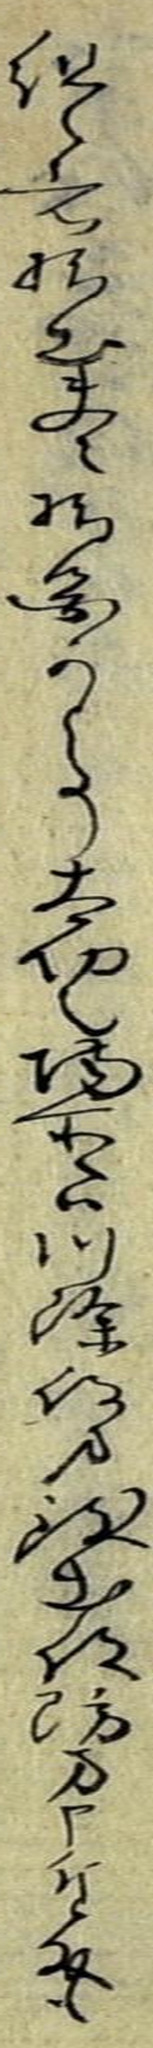組之者指出夫々指図可申事太切之場所ヘハ川除役方致出役防方申付被成も
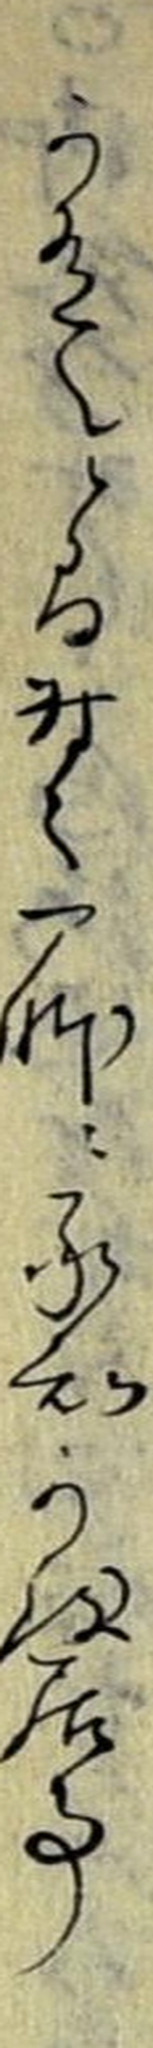可有之候間村々一体ニ承知可致居事
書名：命令之部 三
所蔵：福井県文書館 Fukui Prefectural Archives
